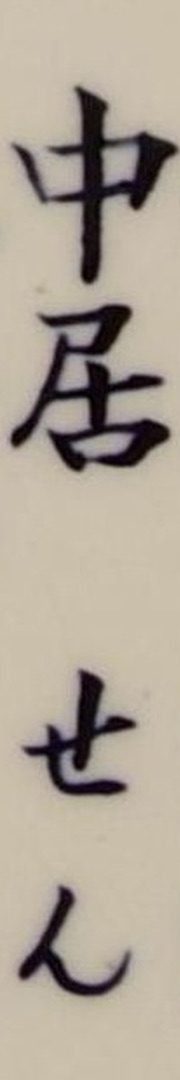中居せん
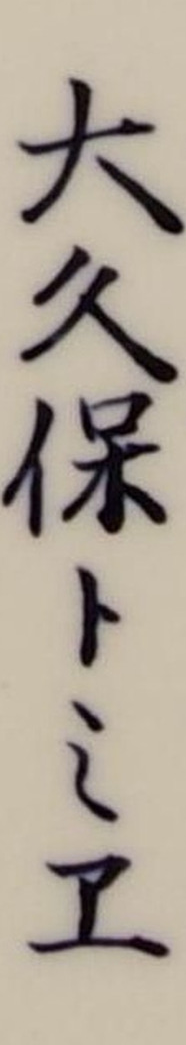大久保トミエ
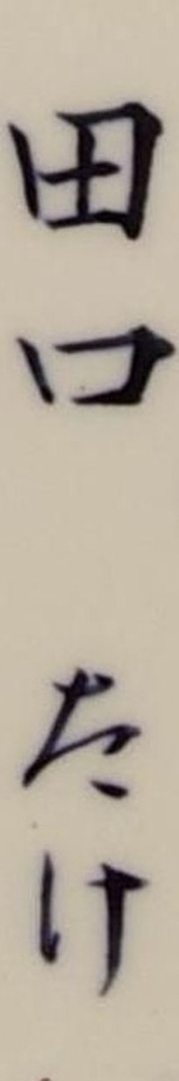田口たけ
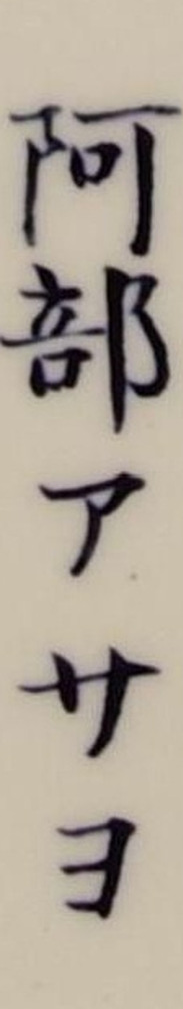阿部アサヨ
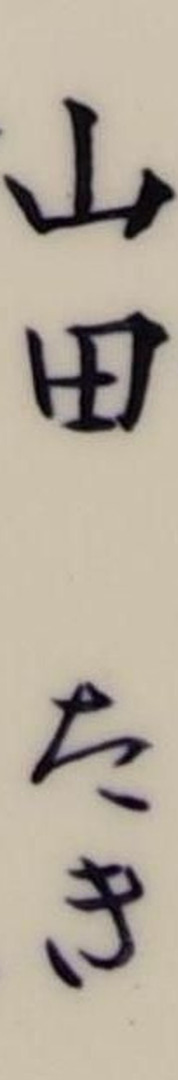山田たき
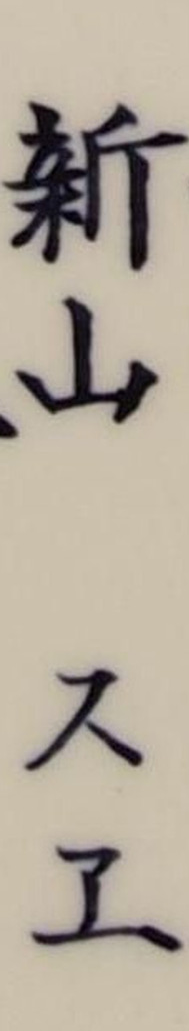新山スエ
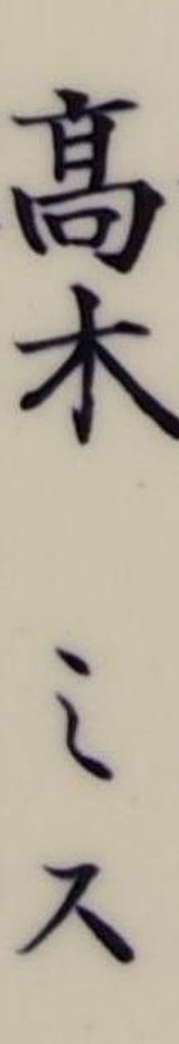高木ミス
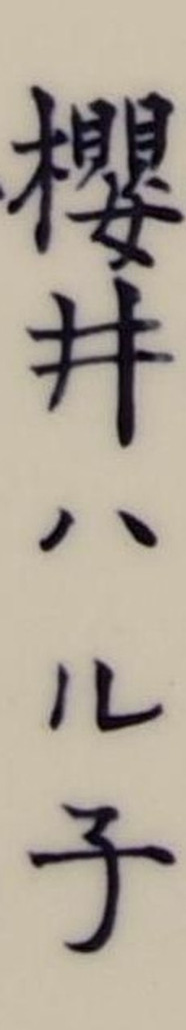桜井ハル子
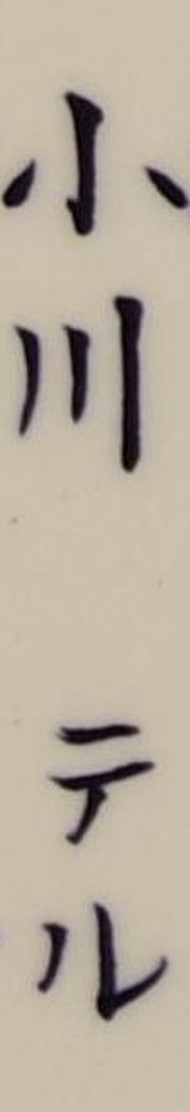小川テル
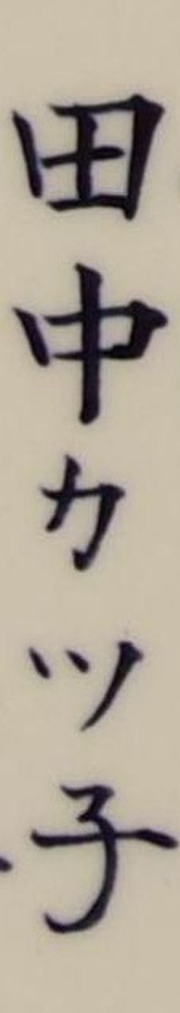田中カツ子
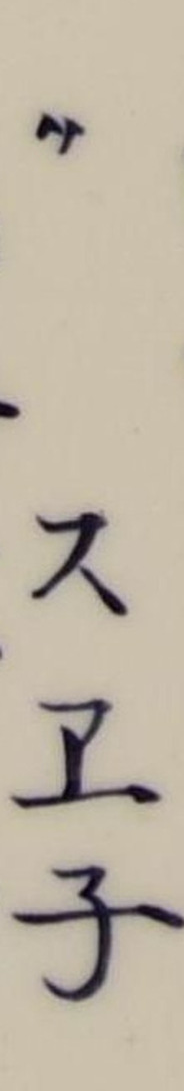スエ子
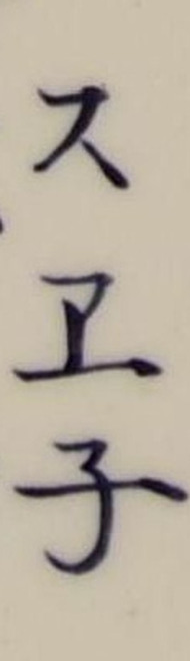スエ子
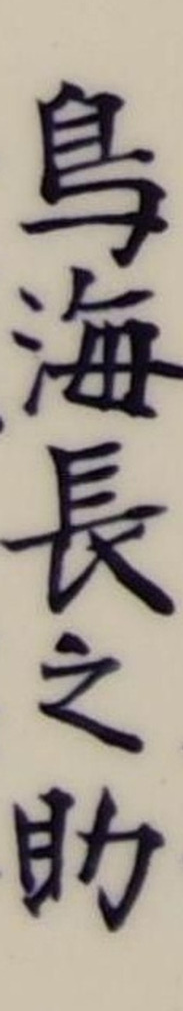鳥海長之助
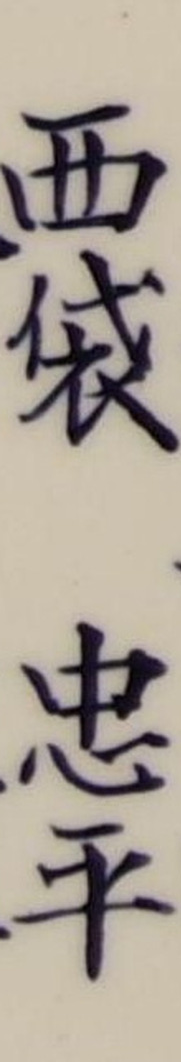西袋忠平
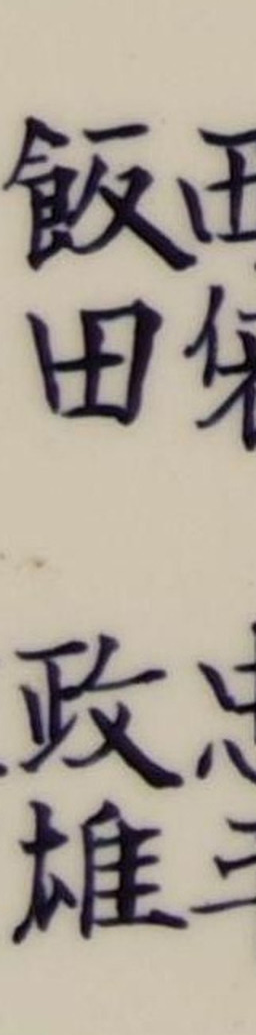飯田政雄

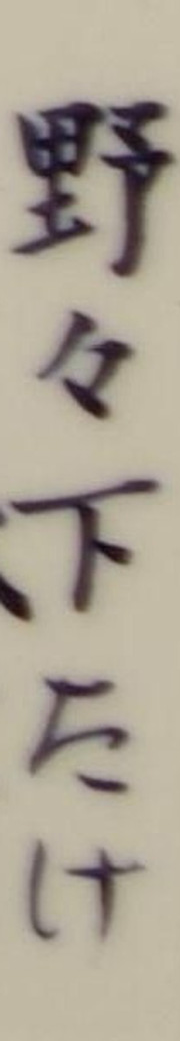野々下たけ
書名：M~S
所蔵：高野山金剛峯寺
